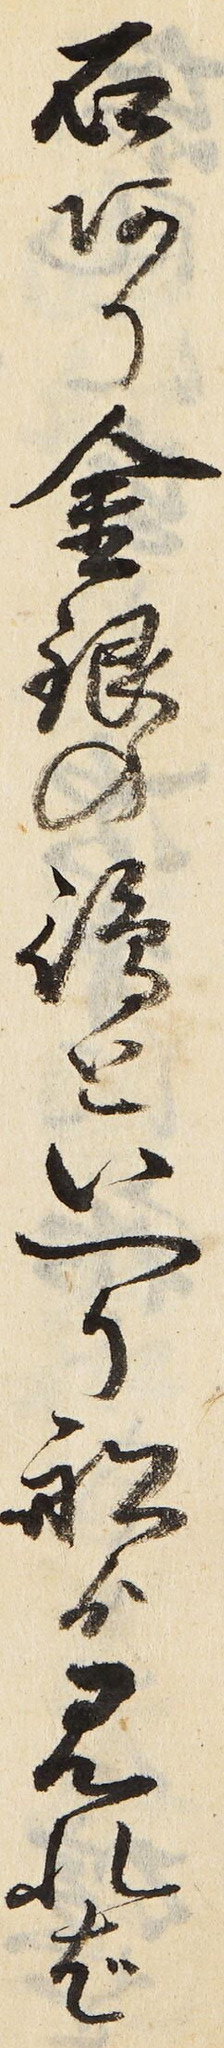石あり金銀の嶋といへり船ゟ見れば
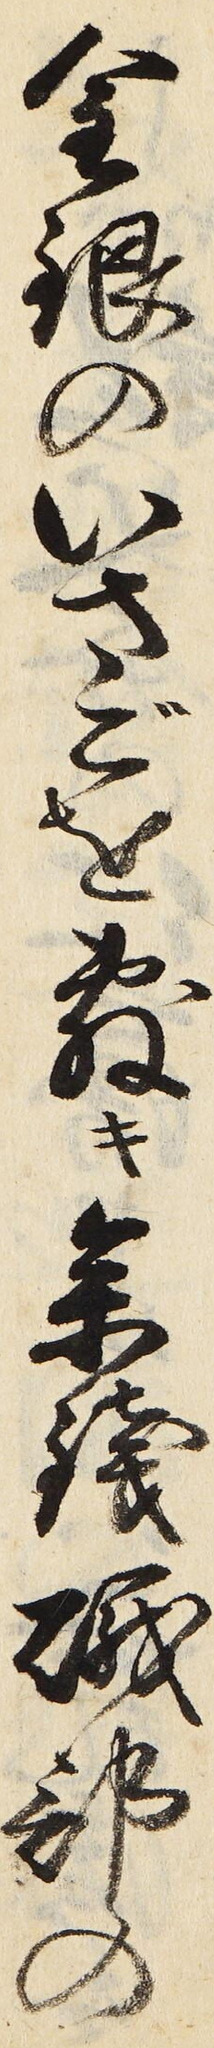金銀のいさごを敷き参銭磯部の
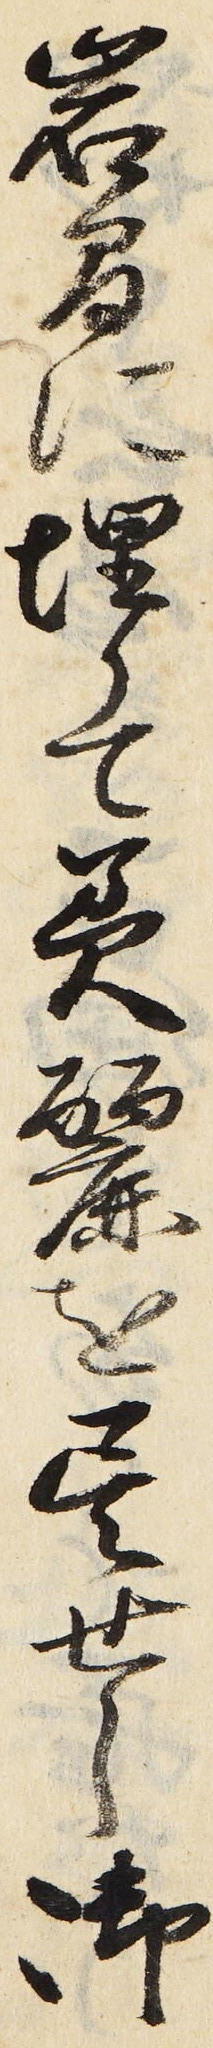岩間に埋りて美麗を尽せし御
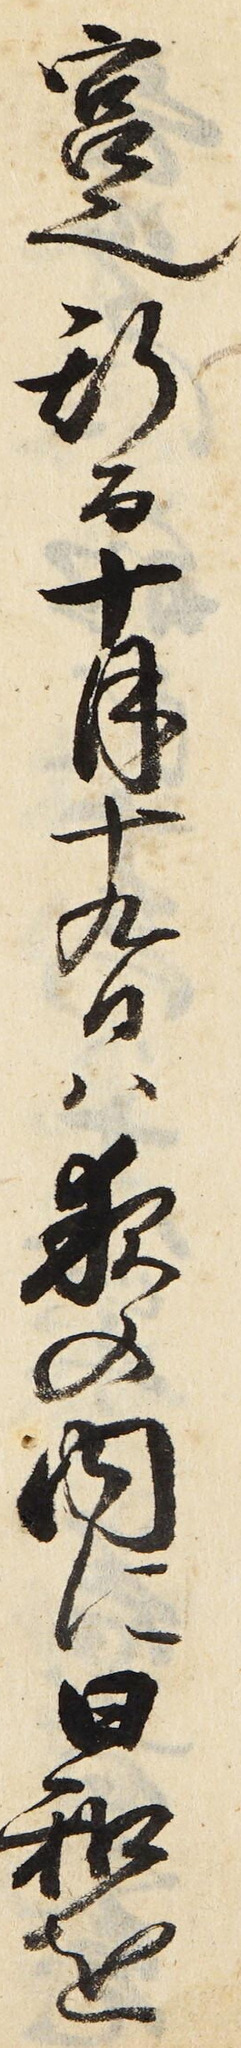宮也斯而十月十九日は夜の内に日和を
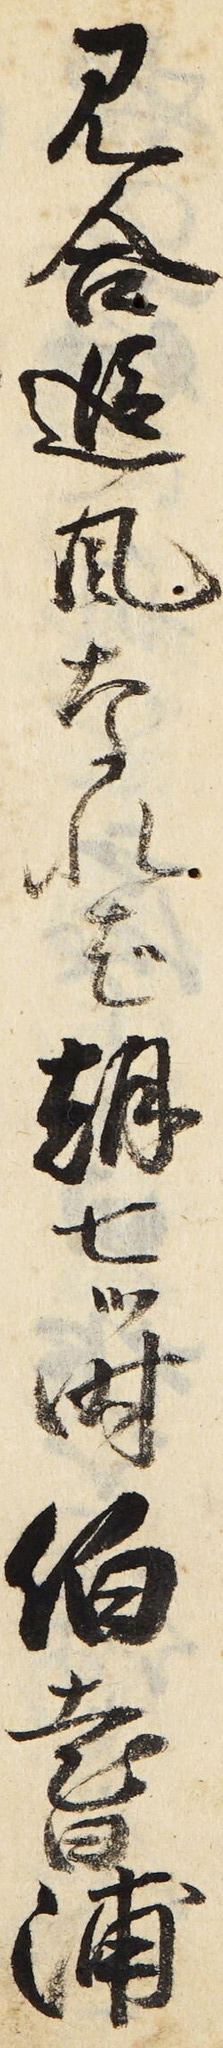見合追風なれば朝七つ時伯耆浦
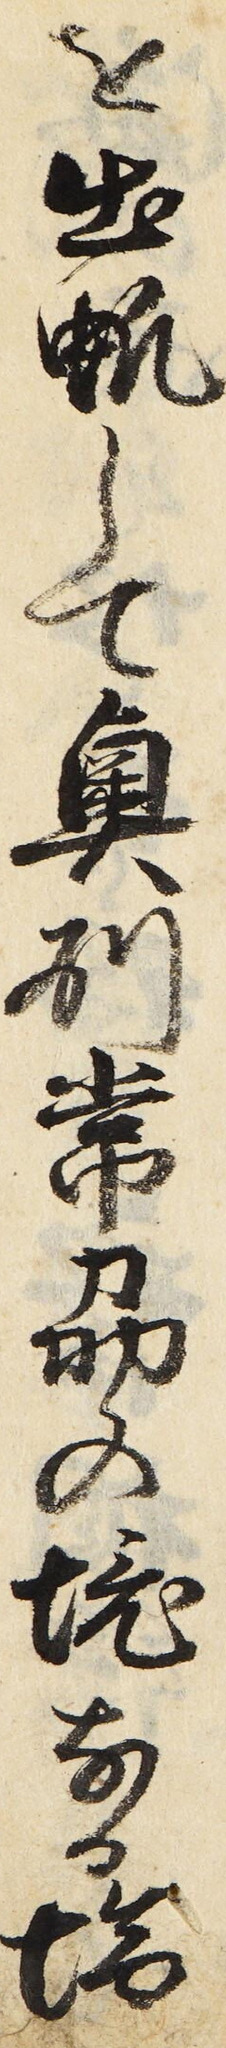を出帆して奥州常州の境なる塩
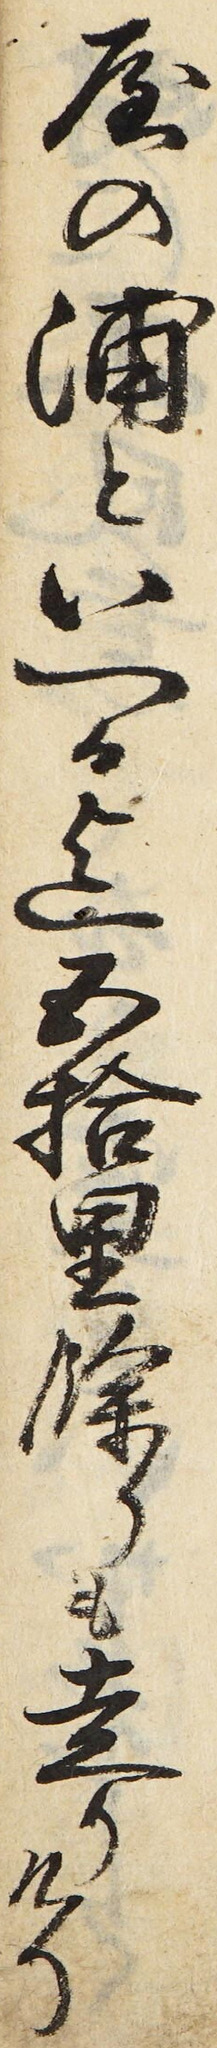屋の浦といへる迠五拾里余りも走りけり

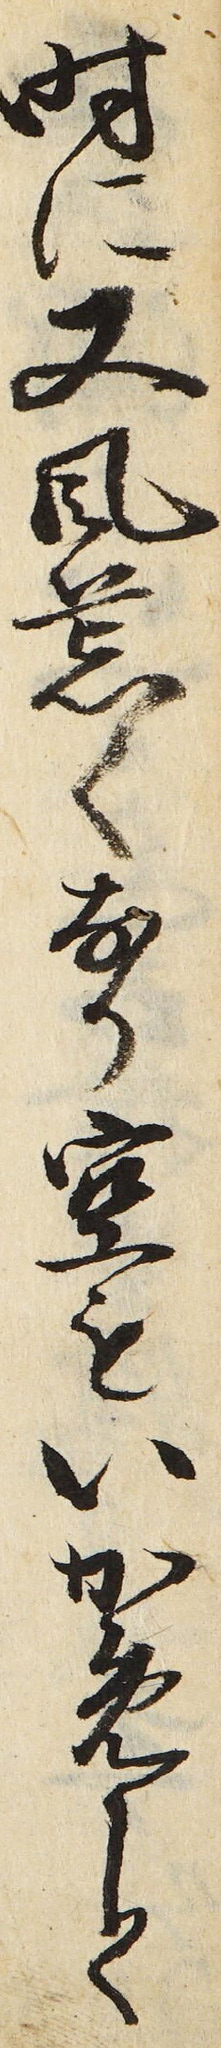時に又風荒くなり空もいかめしく
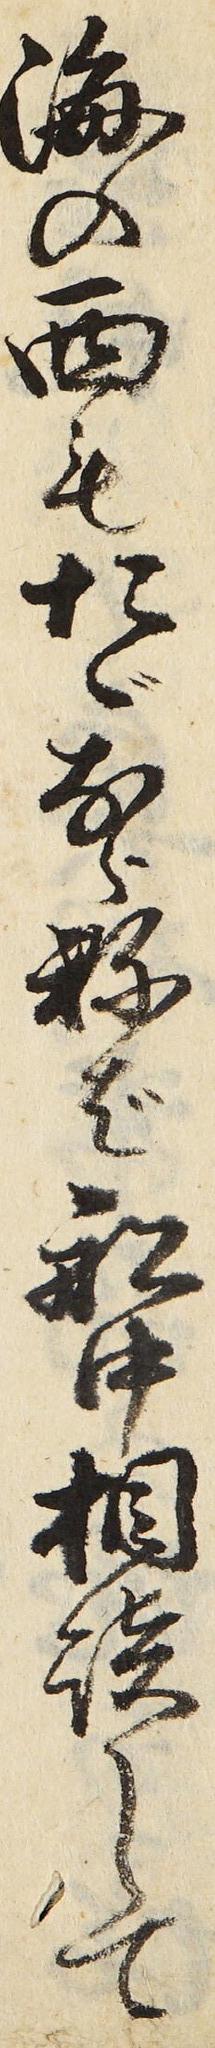海の西もたゞならねば船中相談して
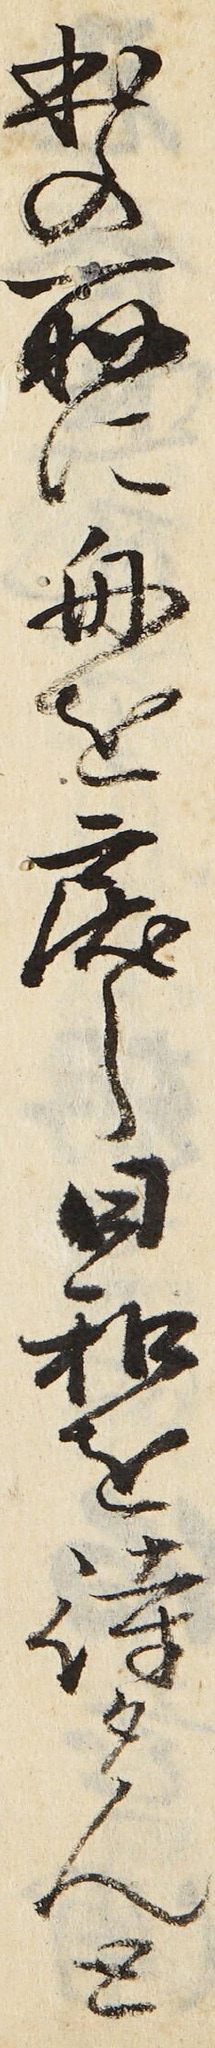本の所に舟を戻し日和を待たんと
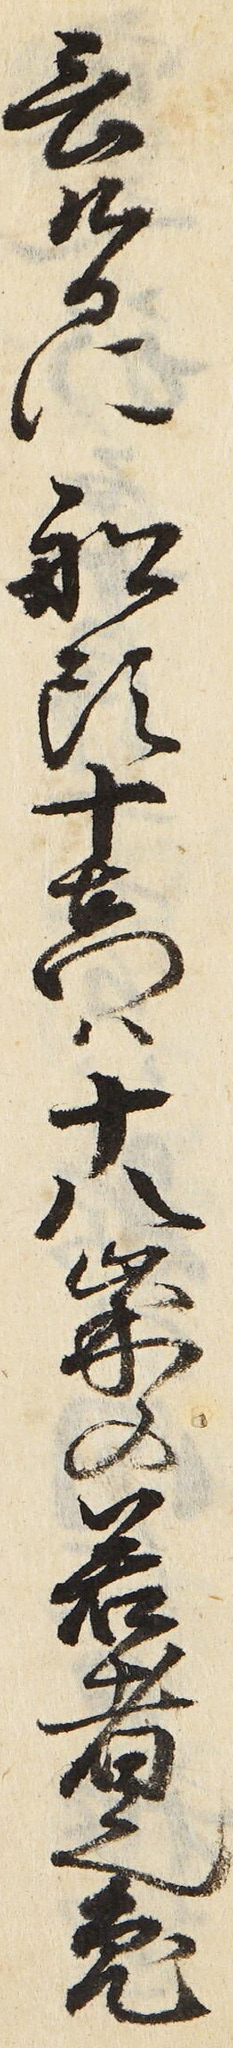云けるに船頭十右衛門は十八歳の若者也兎
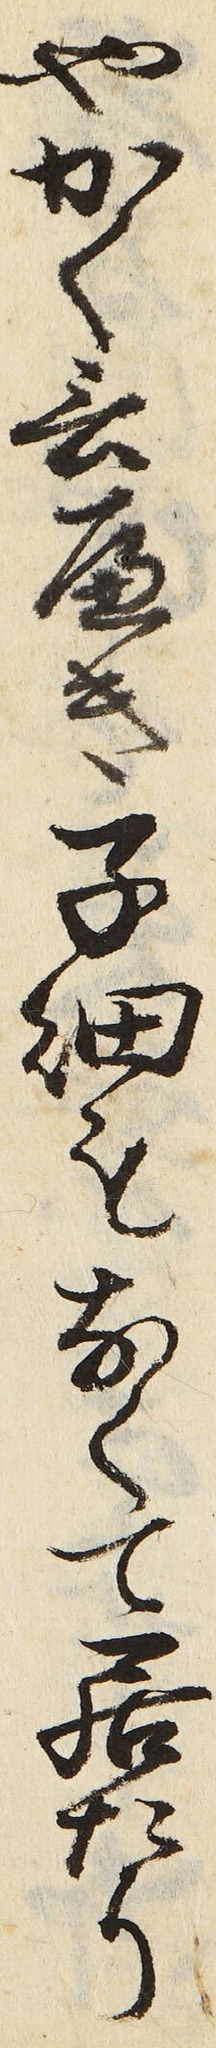やかく云へき子細もなくて居たり
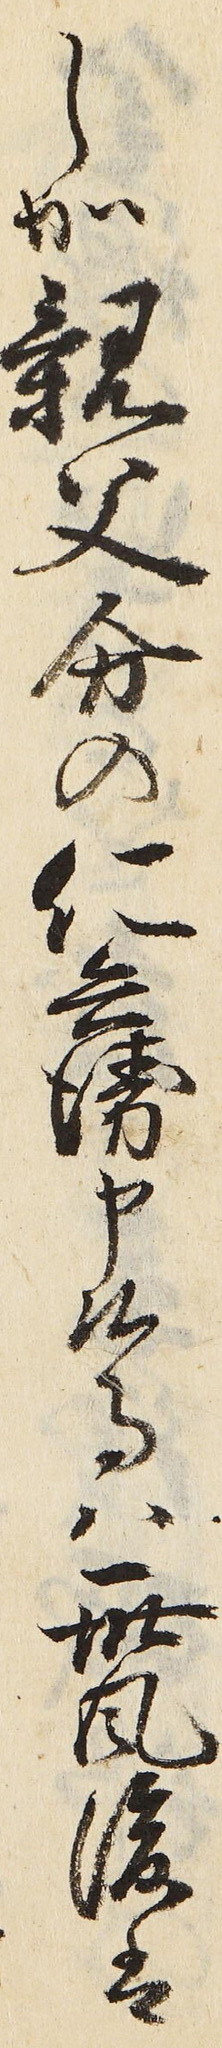しが親父分の仁兵衛申けるは此風後は
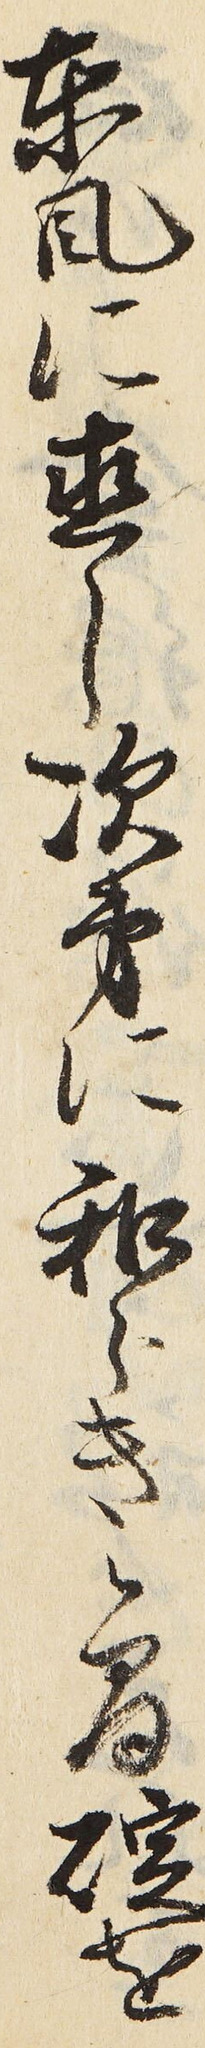東風に直し次第に和らき候間碇を
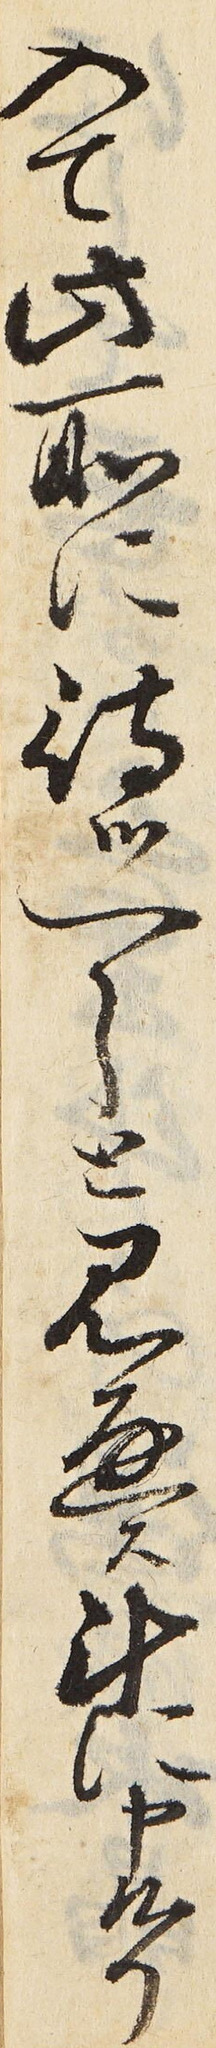入て此所に待つへしと見通す計に申けり
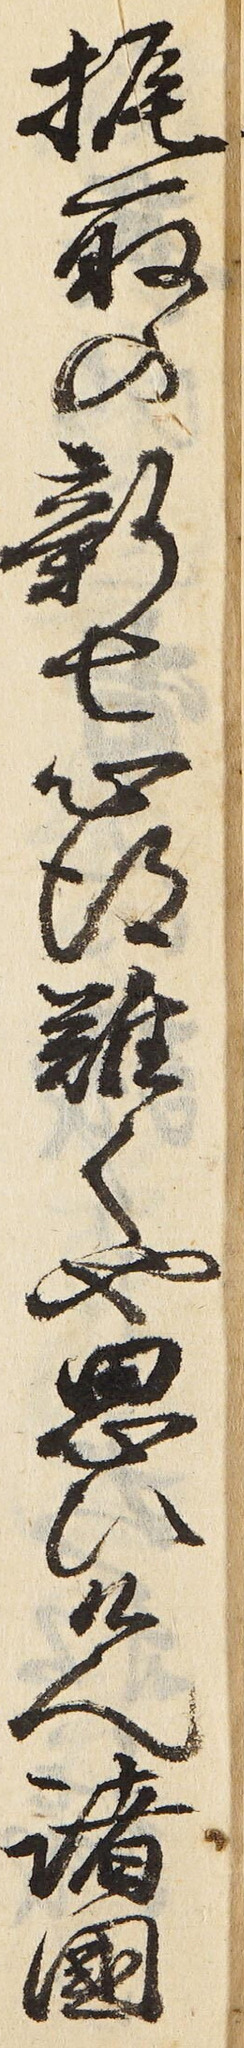梶取の新七心得難くや思ひけん諸国
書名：華夷九年録
